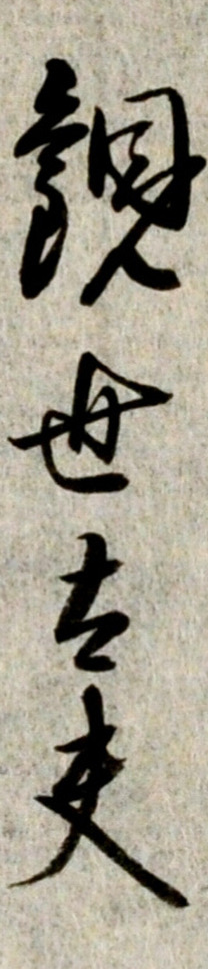観世太夫
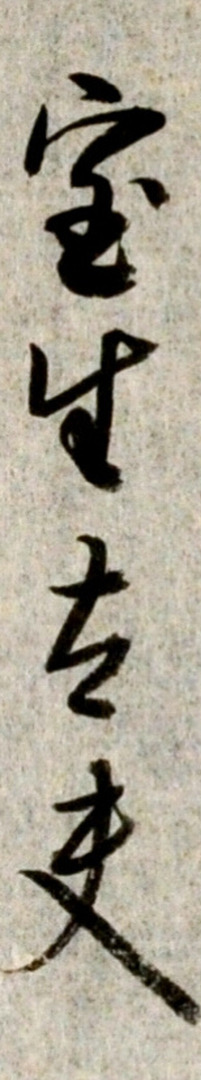宝生太夫
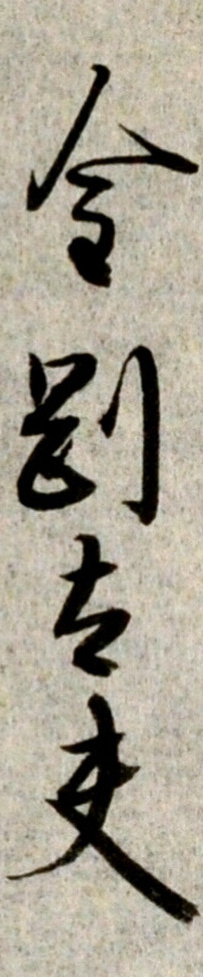金剛太夫
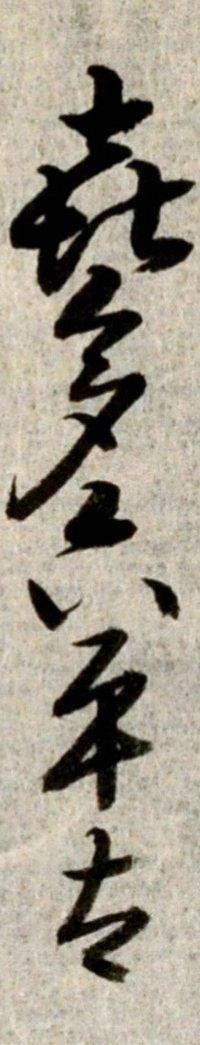喜多六平太
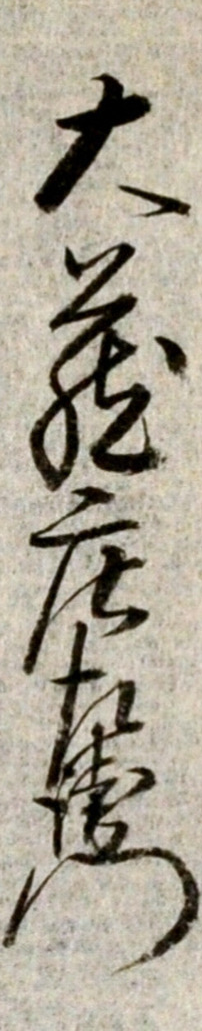大蔵庄左衛門
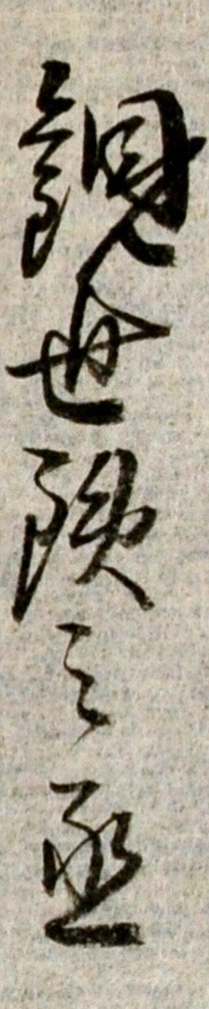観世鉄之丞
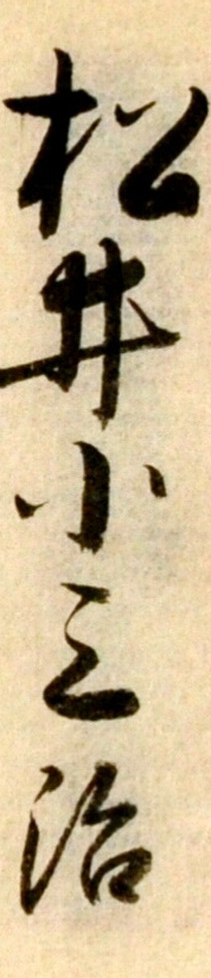松井小三治

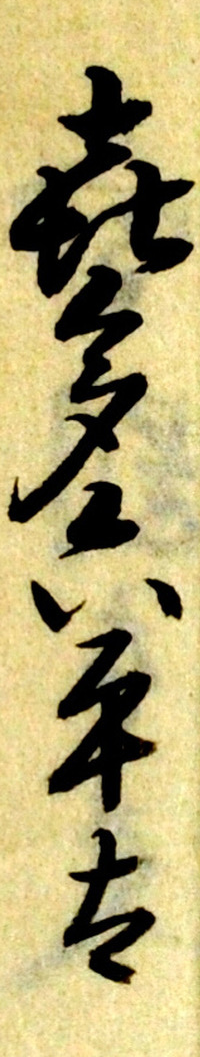喜多六平太
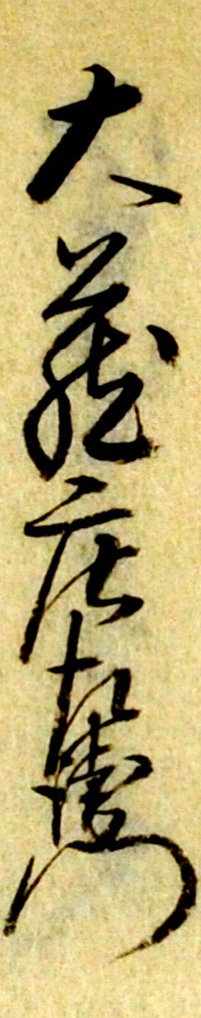大蔵庄左衛門
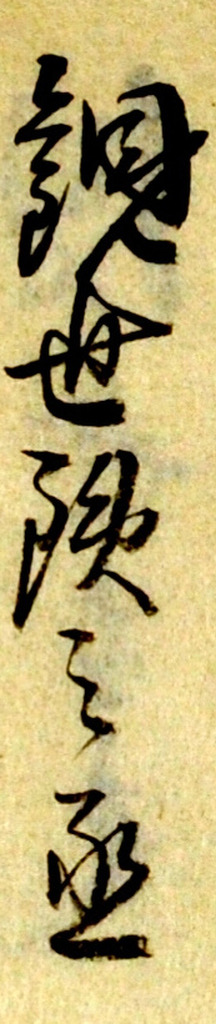観世鉄之丞
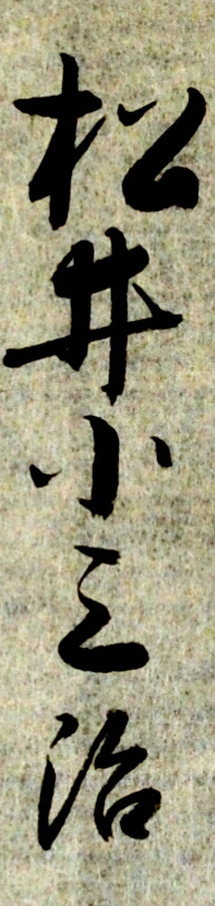松井小三治
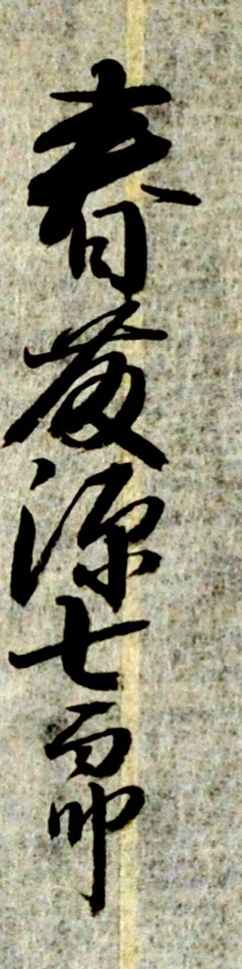春藤源七郎
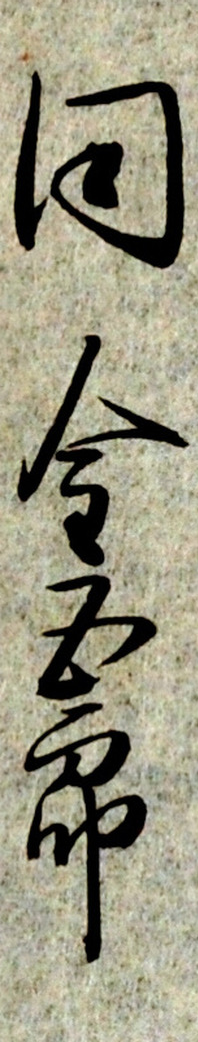同金五郎
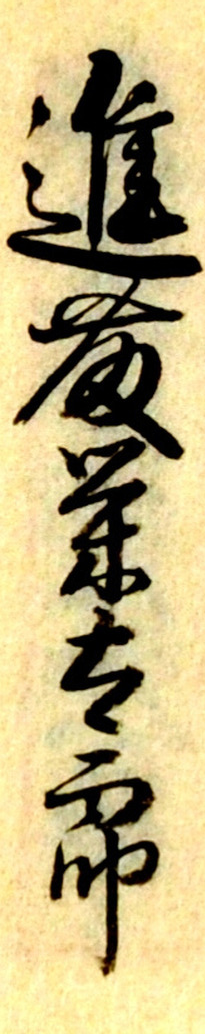進藤栄太郎

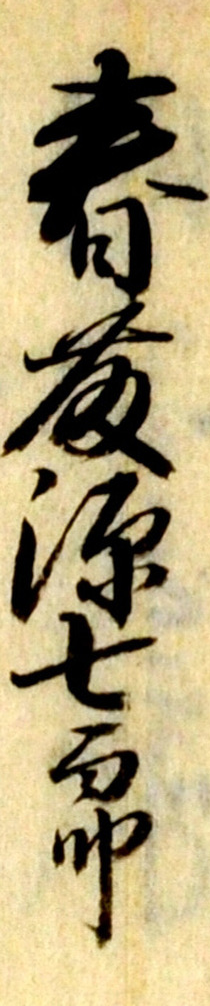春藤源七郎
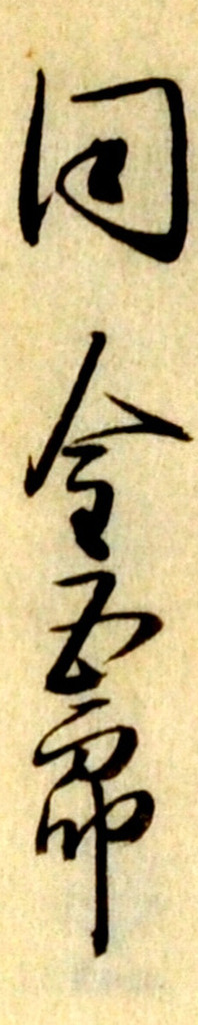同金五郎
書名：若年寄御役中御調書付
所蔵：伊那市立高遠町図書館・合同会社AMANE
